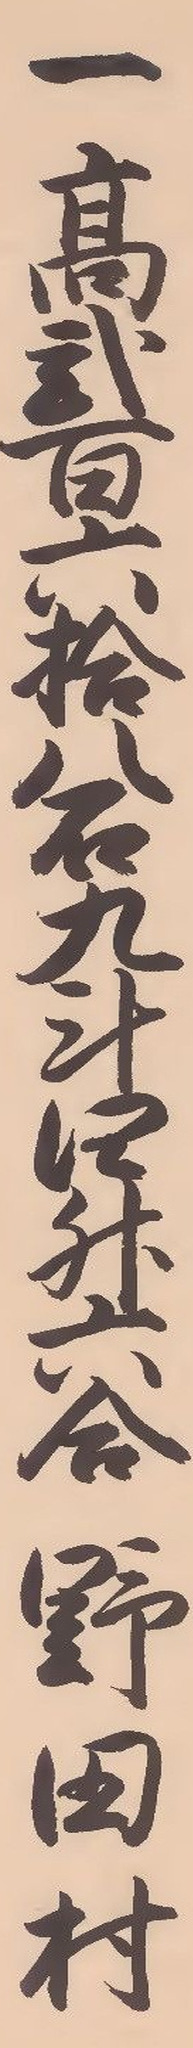一高弐百六拾八石九斗四升六合野田村
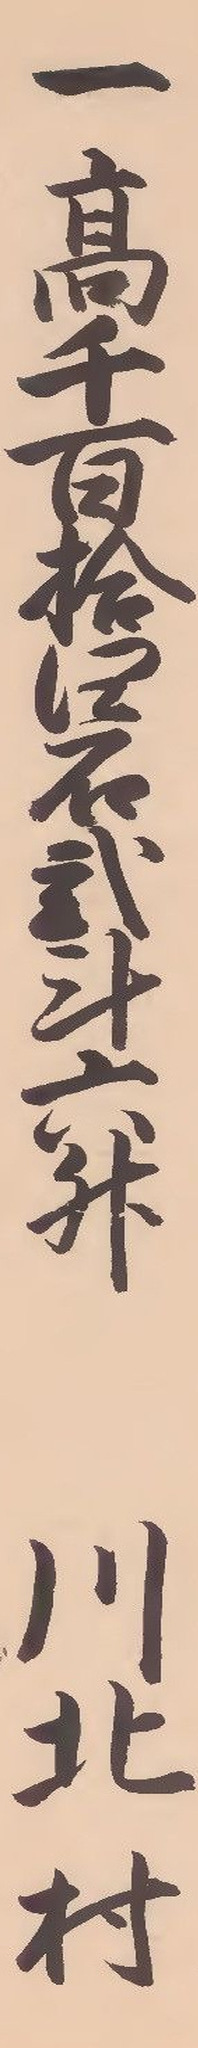一高千百拾四石弐斗六升川北村
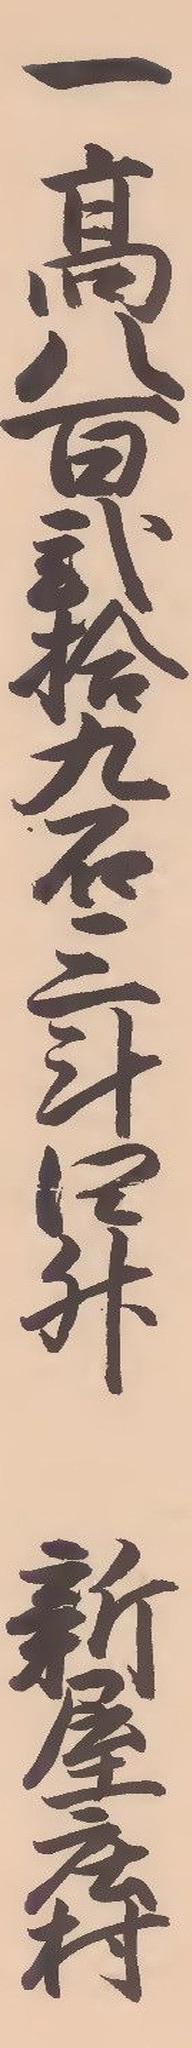一高八百弐拾九石三斗四升新屋庄村

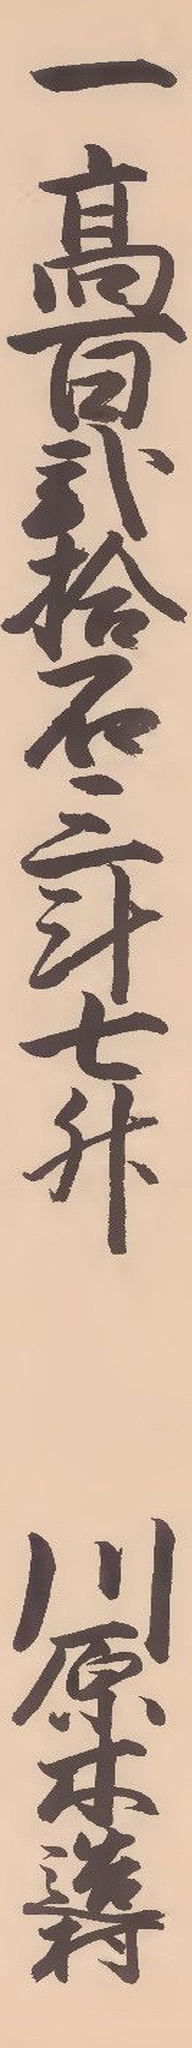一高百弐拾石三斗七升川原木造村
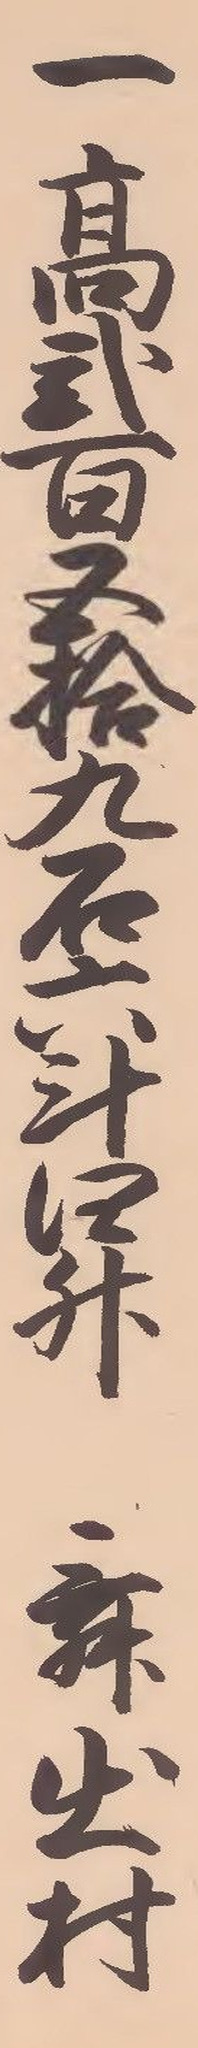一高弐百五拾九石六斗四升舞出村
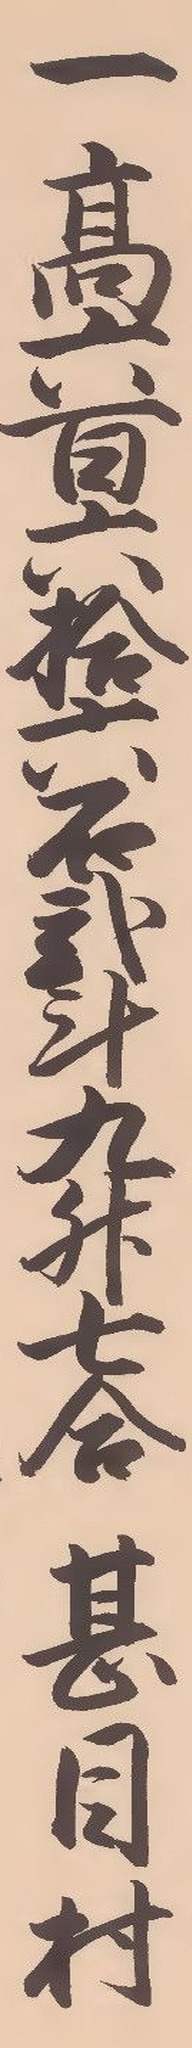一高六百六拾六石弐斗九升七合甚目村
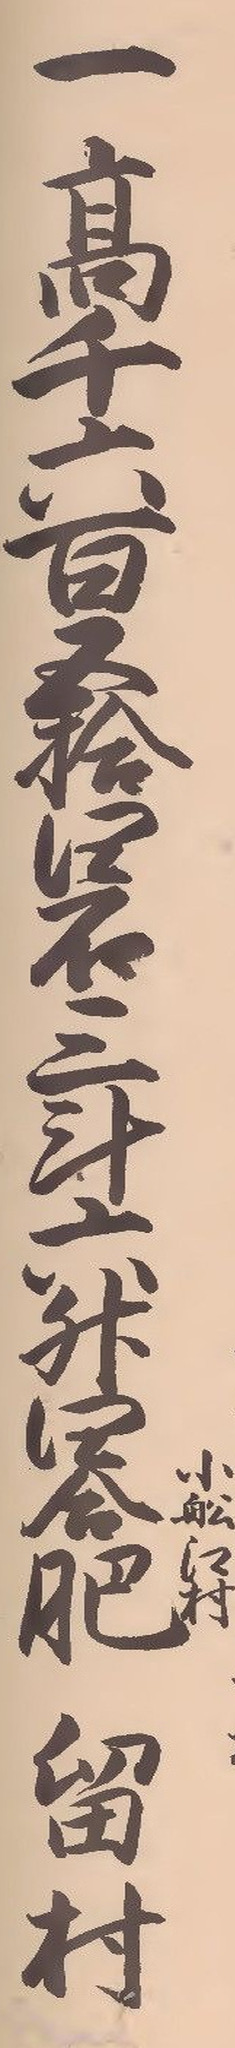一高千七百五拾四石弐斗五升九合黒野村
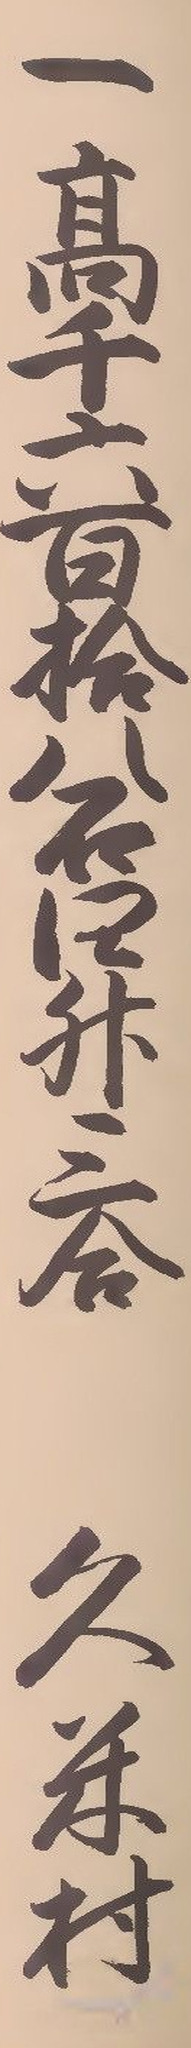一高千六百拾八石四升三合久米村
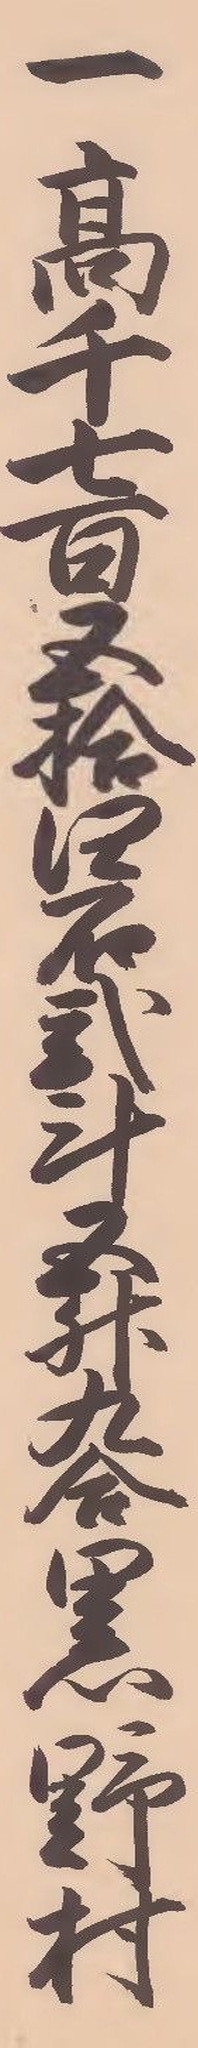一高千七百五拾四石弐斗五升九合黒野村
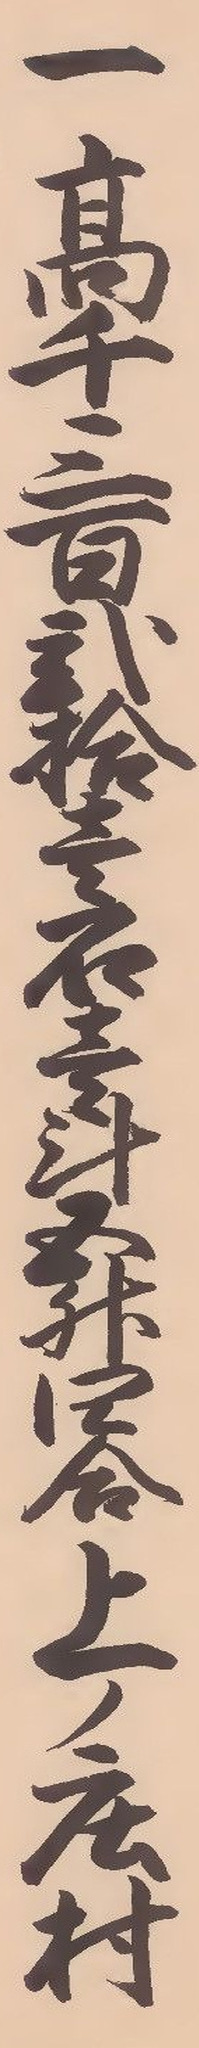一高千三百弐拾壱石壱斗五升四合上ノ庄村
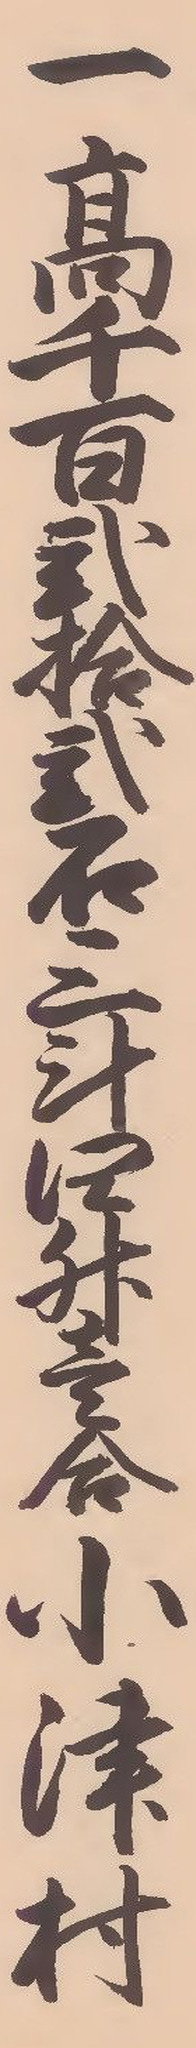一高千百弐拾弐石三斗四升壱合小津村

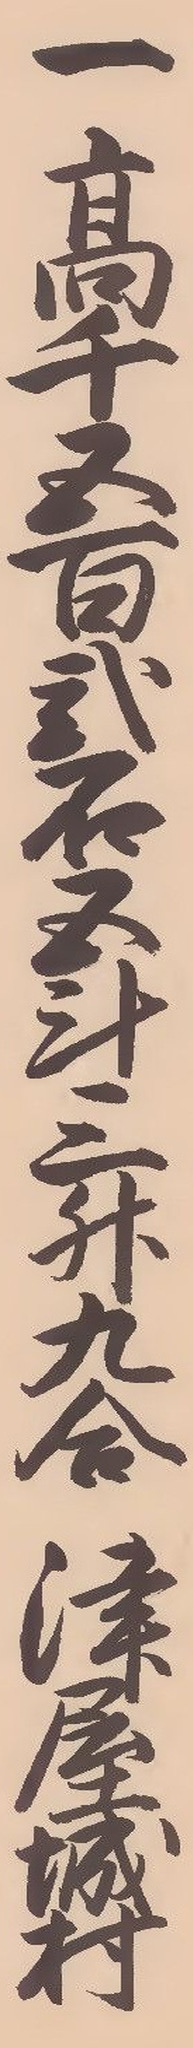一高千五百弐石五斗三升九合津屋城村
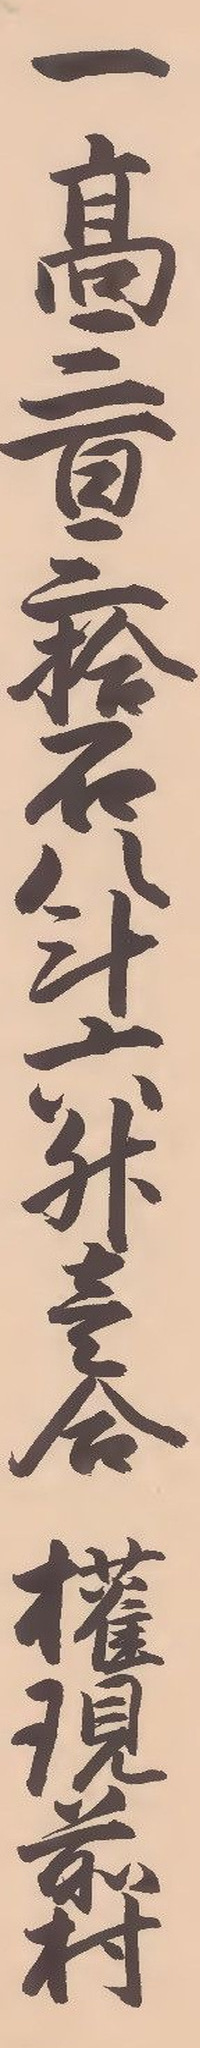一高三百三拾石八斗六升壱合権現前村
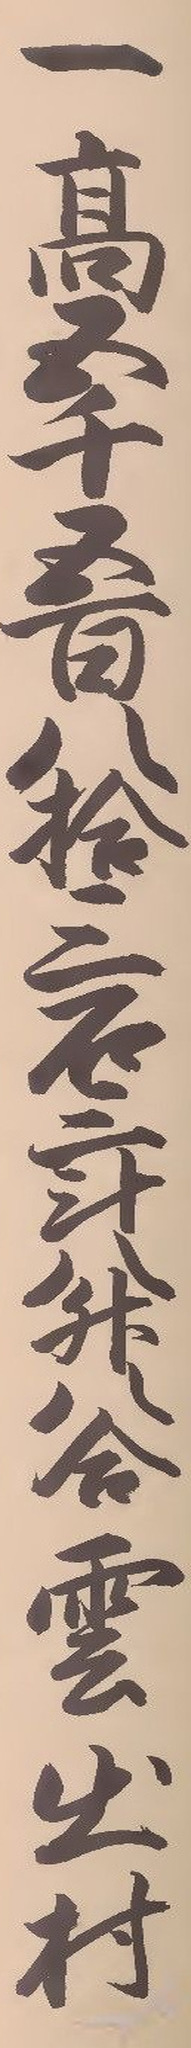一高五千五百八拾三石三斗八升八合雲出村
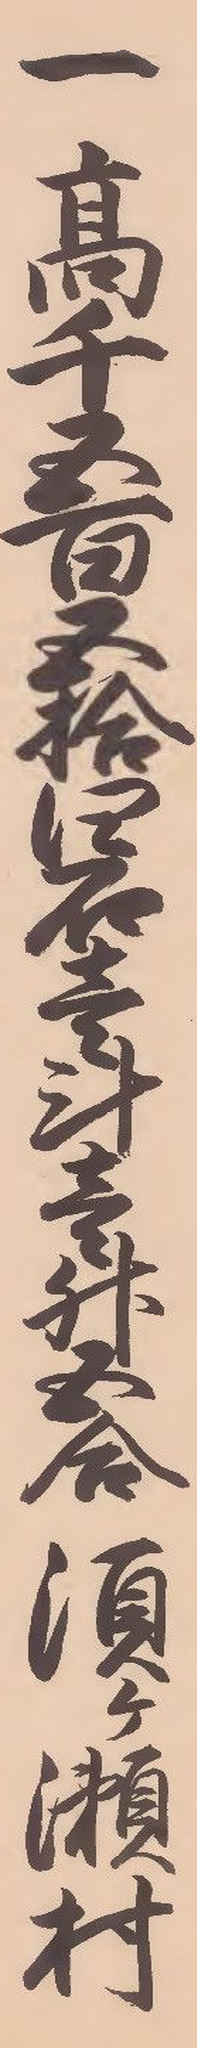一高千五百五拾四石壱斗壱升五合須ケ瀬村
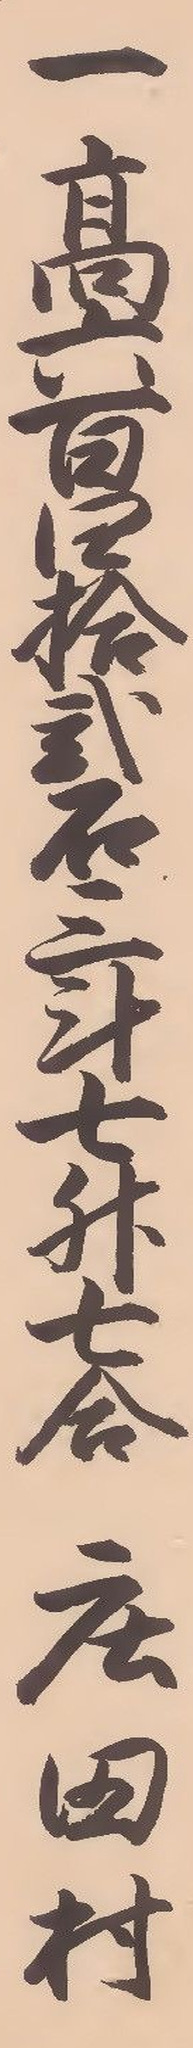一高六百四拾弐石三斗七升七合庄田村
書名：伊勢国郷帳
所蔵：国立公文書館 National Archives of Japan
